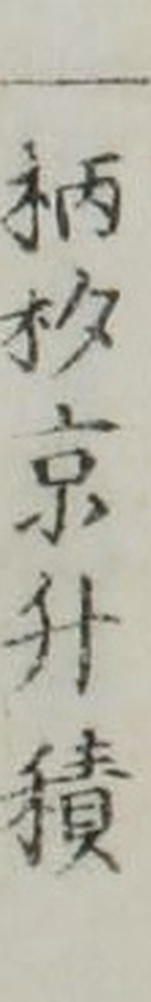柄杓京升積
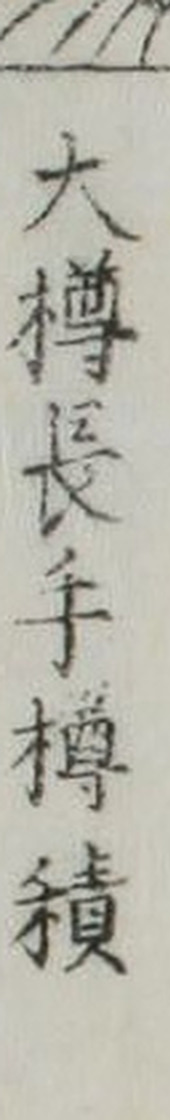大樽長手樽積
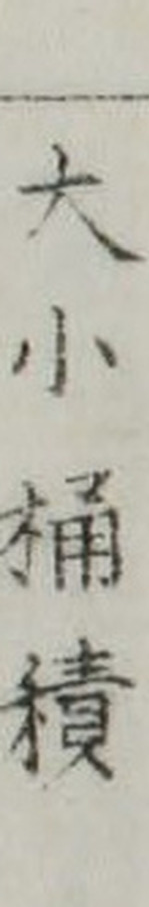大小桶積
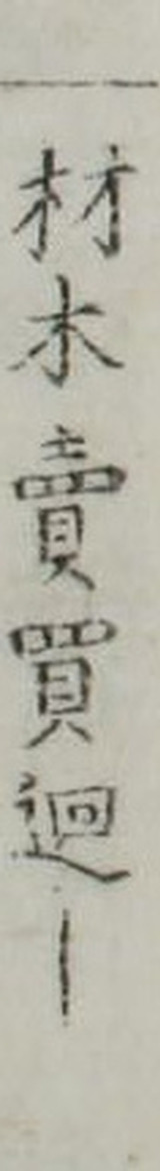材木売買廻し

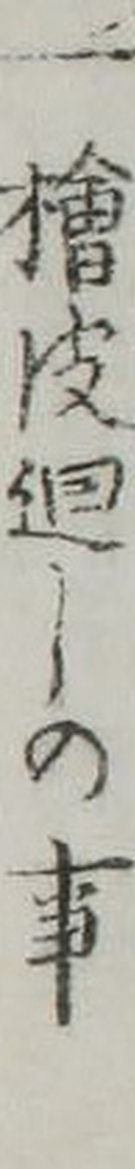檜皮廻しの事
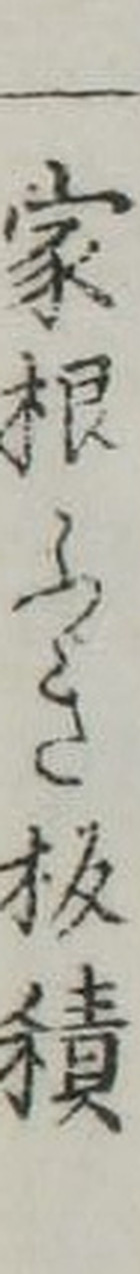家根ふき板積
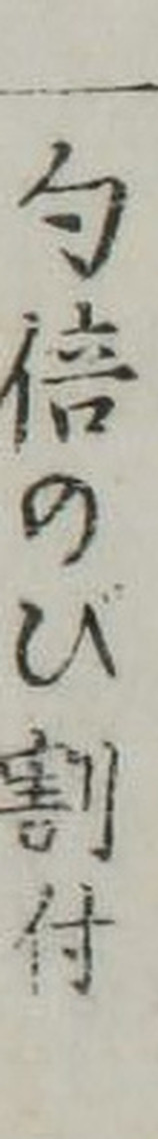勺倍のび割付
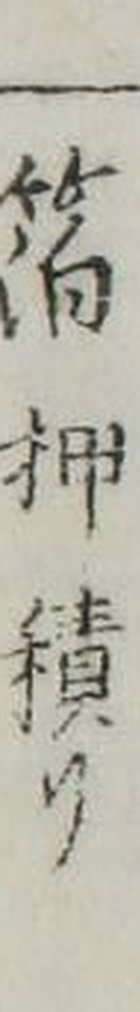箔押積り
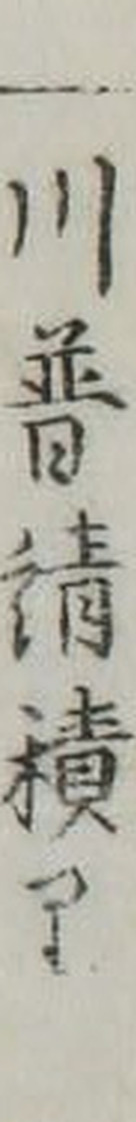川普請積り
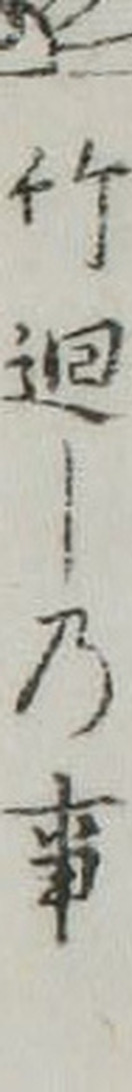竹廻しの事
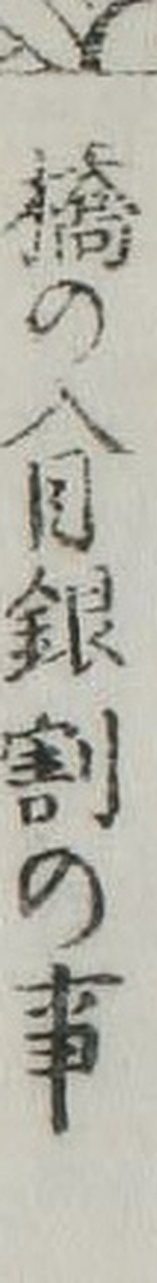橋の入目銀割の事
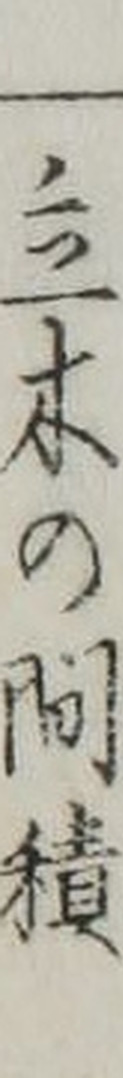立木の間積
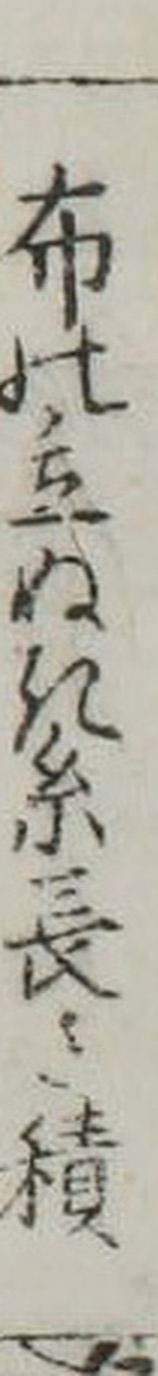布の立ぬき糸長さ積
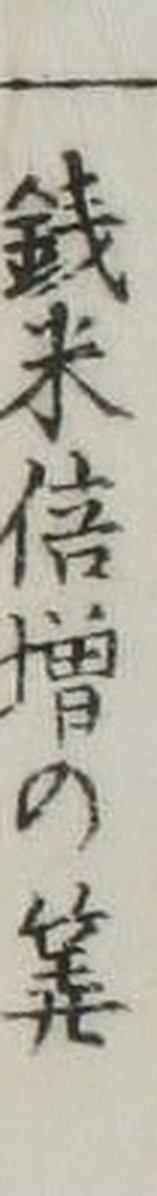銭米倍増の算
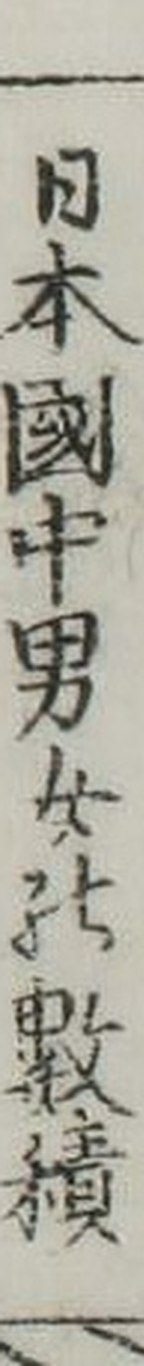日本国中男女の数積
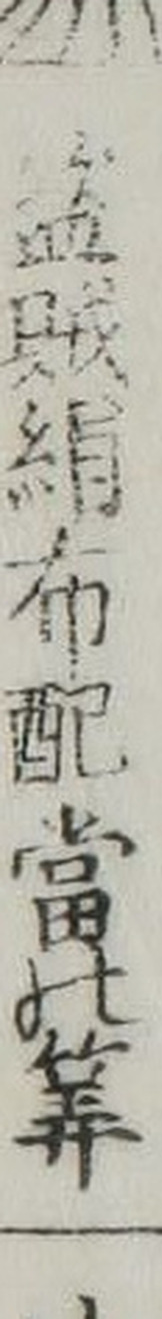盗賊絹布配当の算
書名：宝玉塵劫記
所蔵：東京学芸大学教育コンテンツアーカイブ
